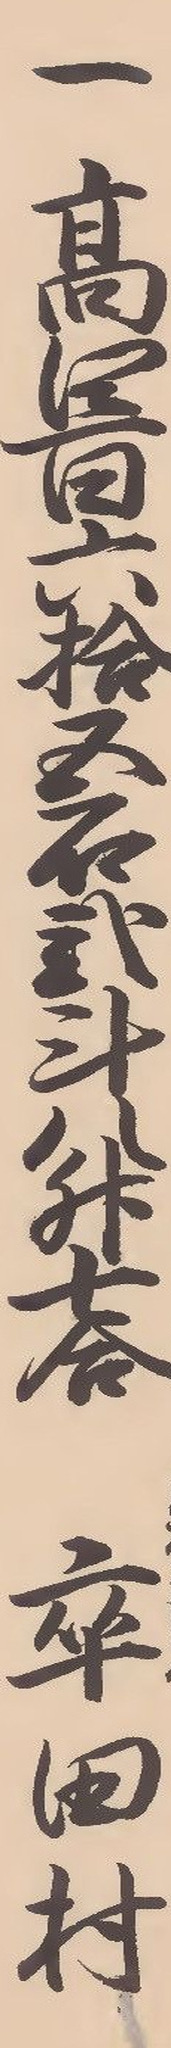一高四百六拾五石弐斗八升七合卒田村
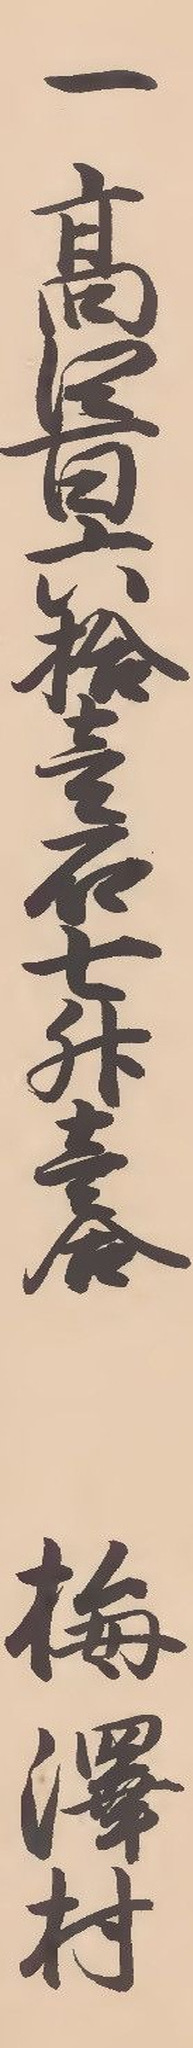一高四百六拾壱石七升壱合梅沢村
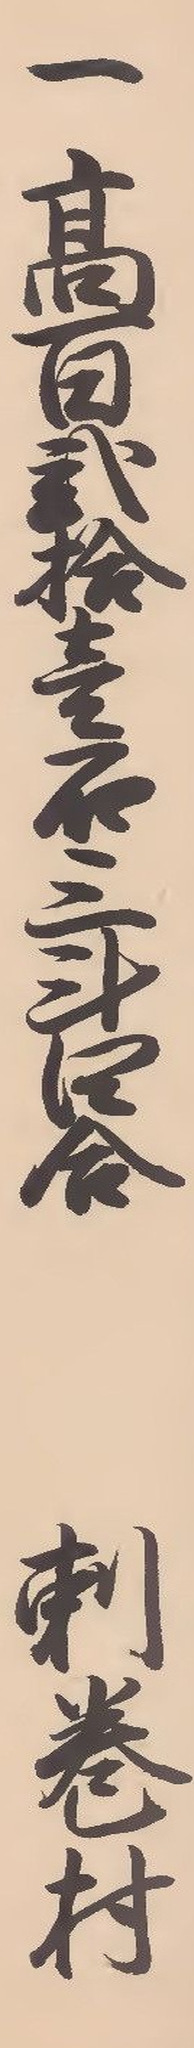一高百弐拾壱石三斗四合刺巻村
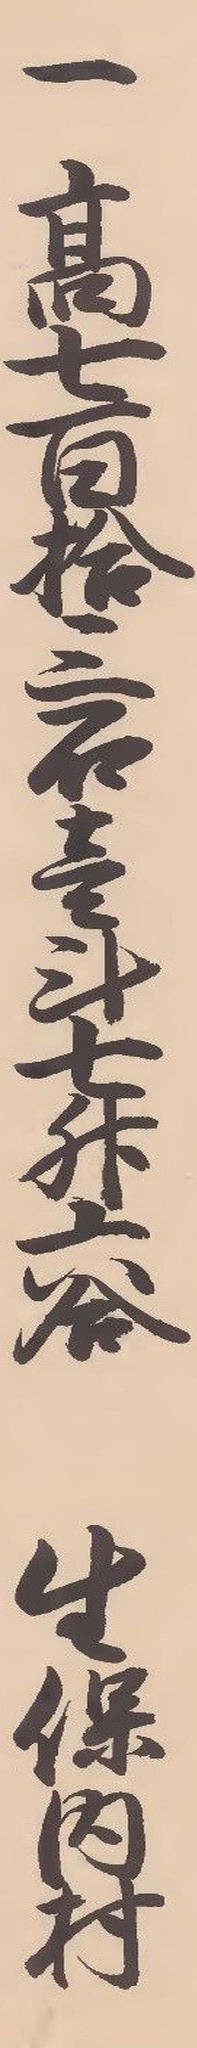一高七百拾三石壱斗七升六合生保内村
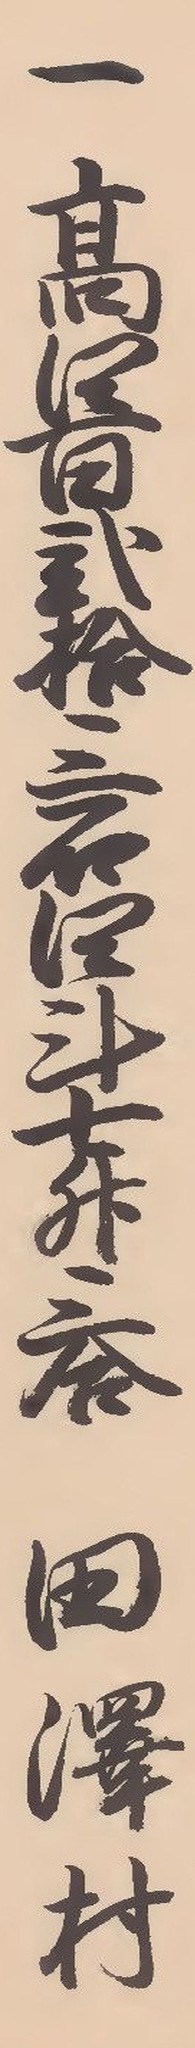一高四百弐拾三石四斗七升三合田沢村
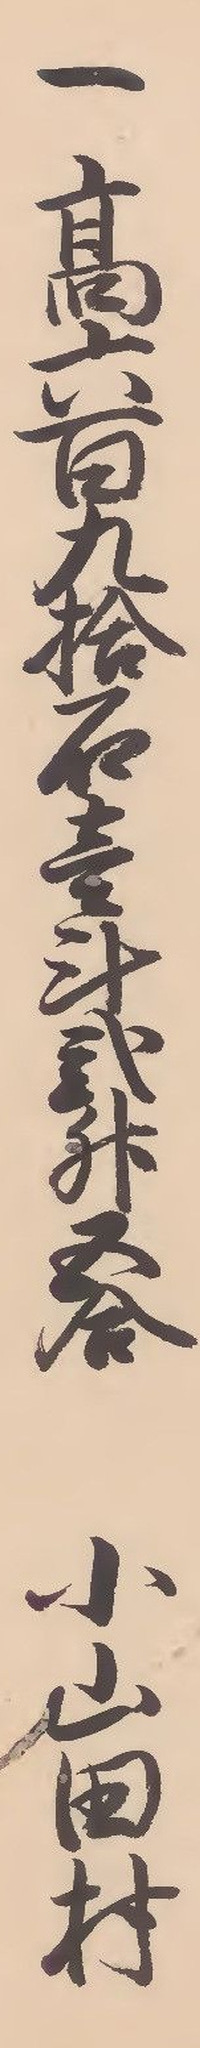一高六百九拾石壱斗弐升五合小山田村

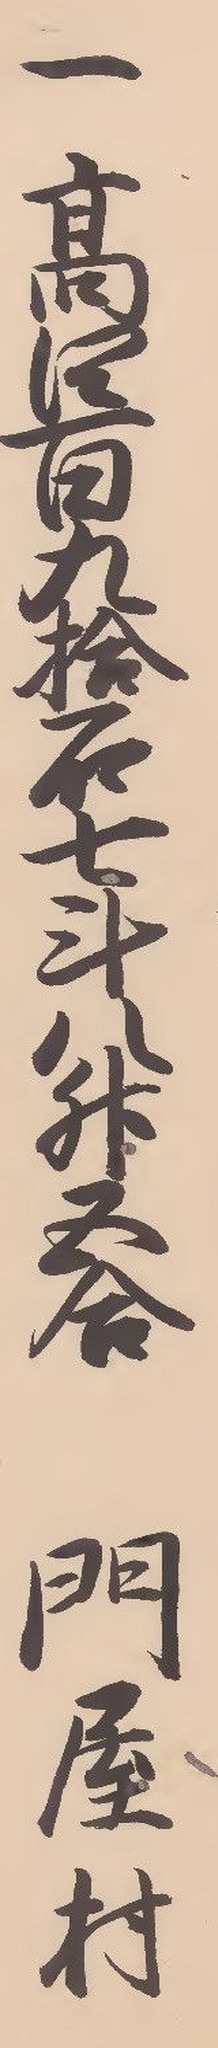一高四百九拾石七斗八升五合門屋村
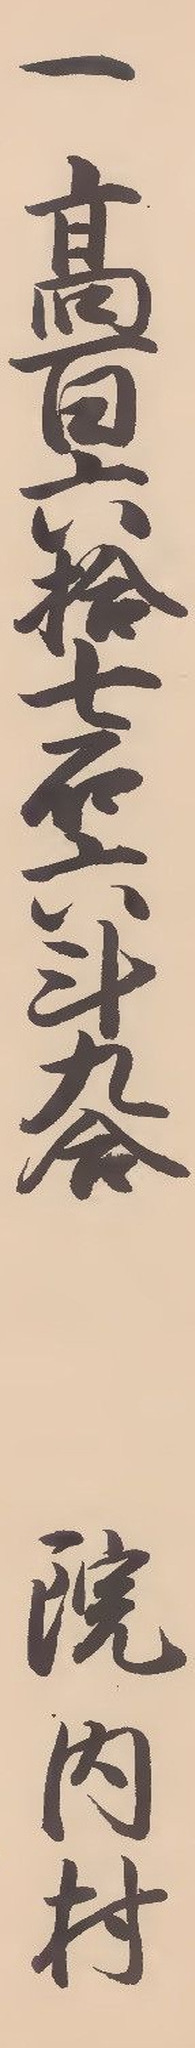一高百六拾七石六斗九合院内村
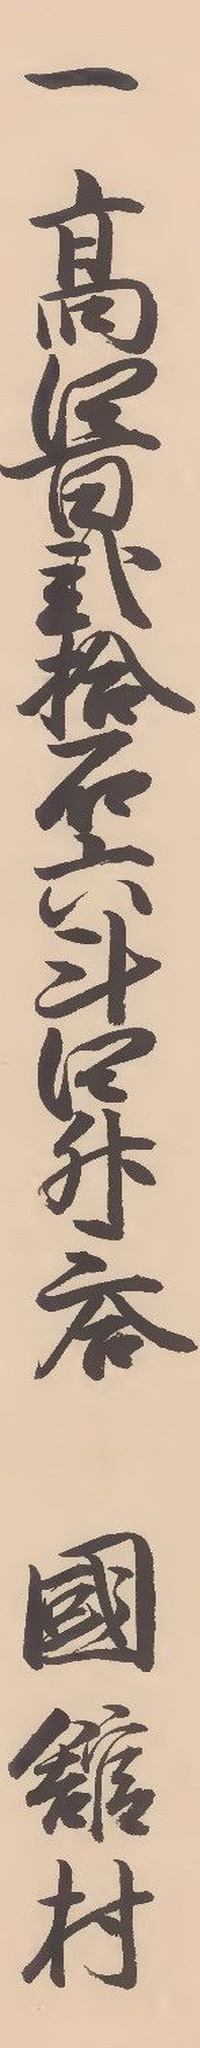一高四百弐拾石六斗四升三合国館村
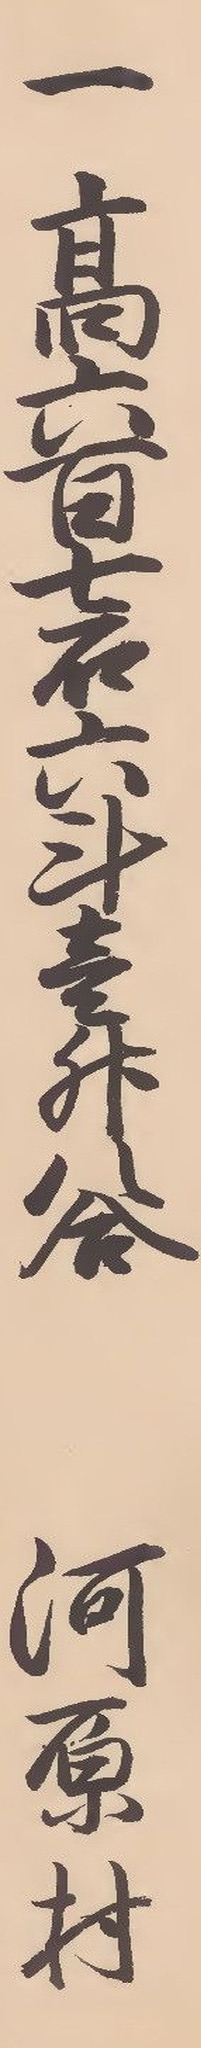一高六百七石六斗壱升八合河原村
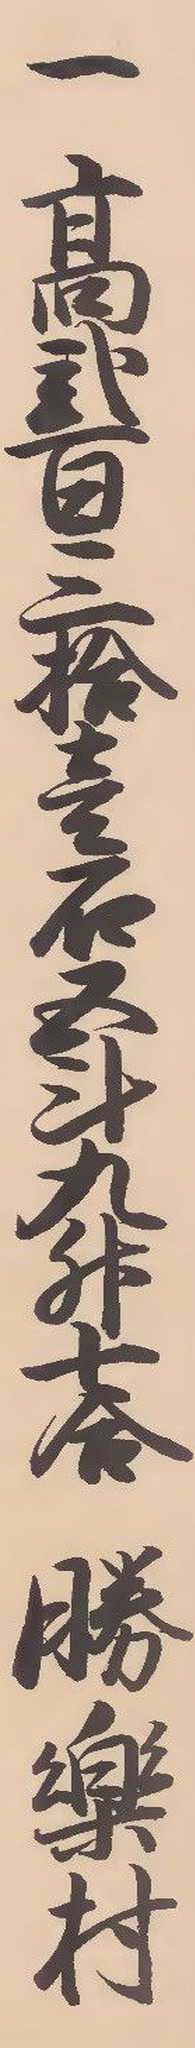一高弐百三拾壱石五斗九升七合勝楽村
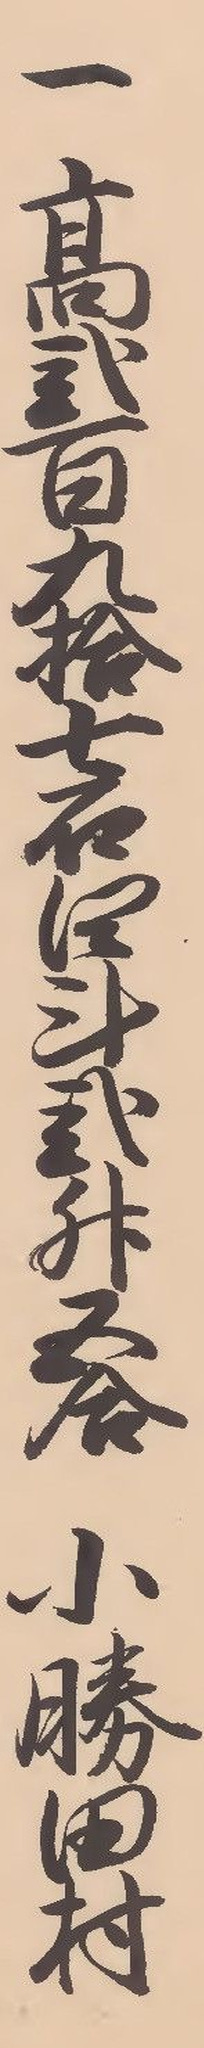一高弐百九拾七石四斗弐升五合小勝田村
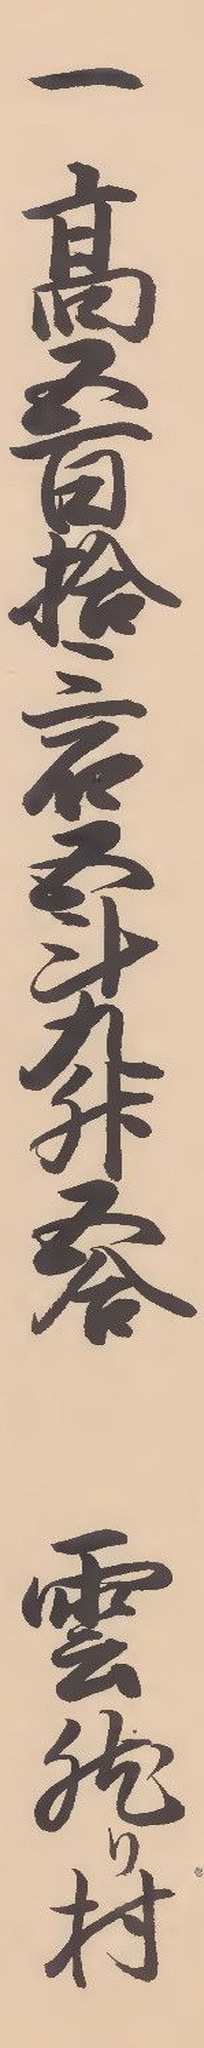一高五百拾三石五斗九升五合雲然り村
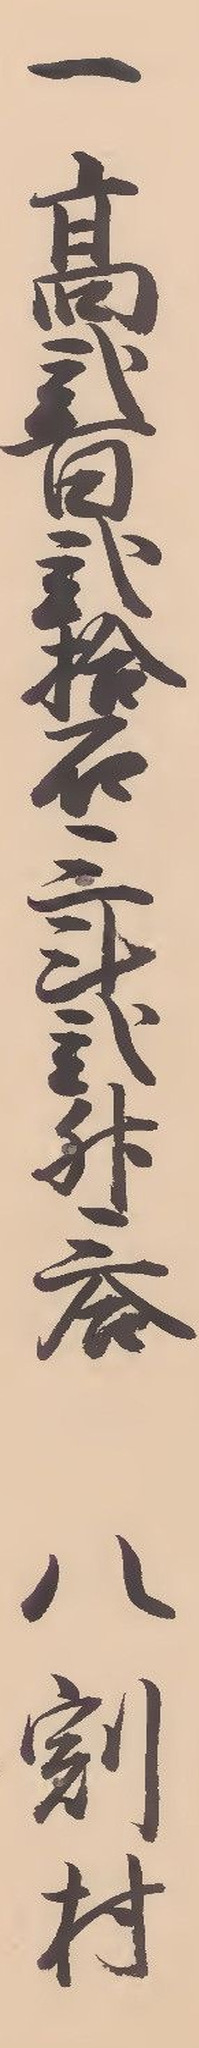一高弐百弐拾石三斗弐升三合八割村

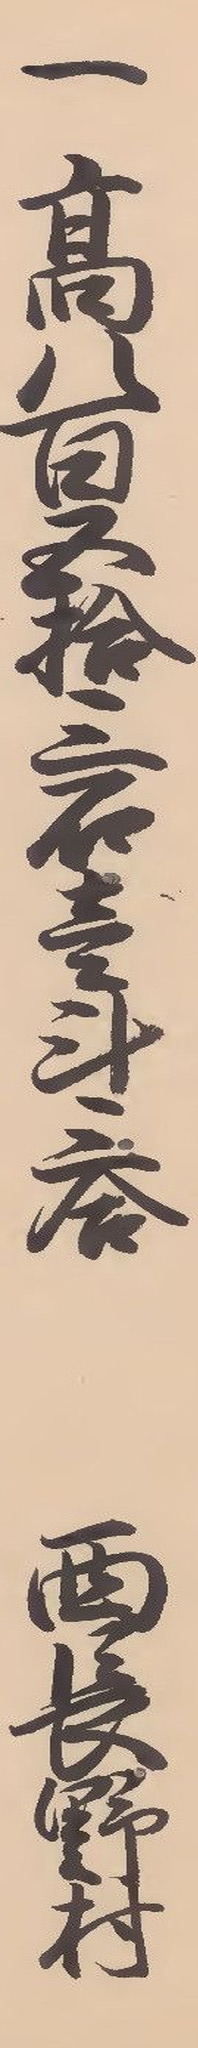一高八百五拾三石壱斗三合西長野村
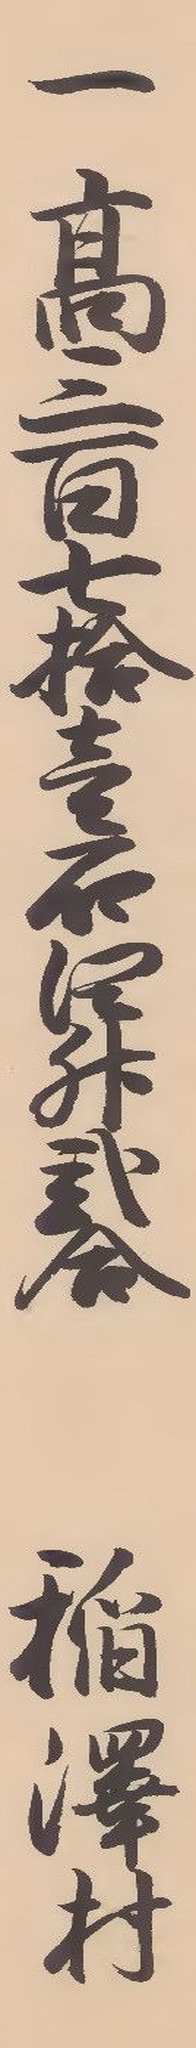一高三百七拾壱石四升弐合稲沢村
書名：出羽国郷帳　５
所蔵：国立公文書館 National Archives of Japan
